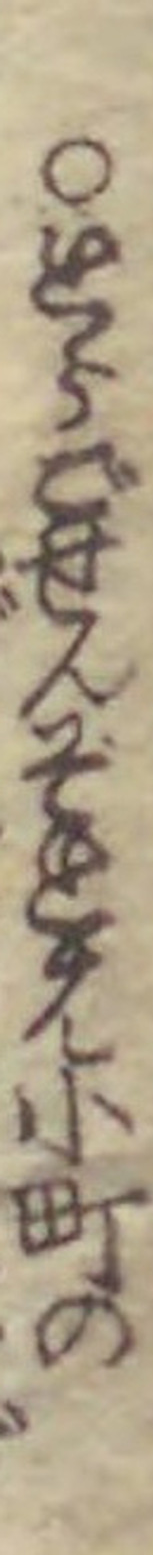○とらごせんそとは小町の
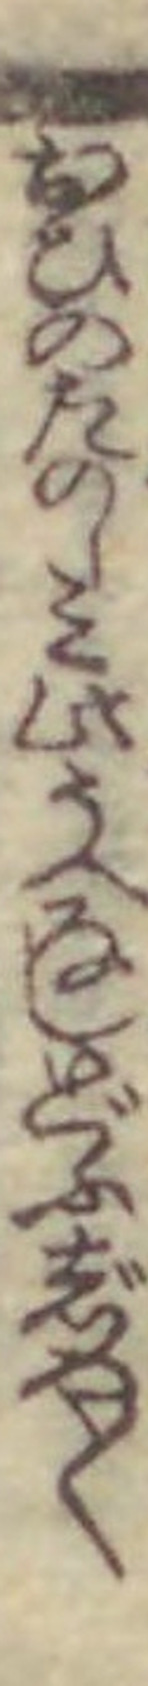おひのたのしみ此うへなしどふじや〳〵
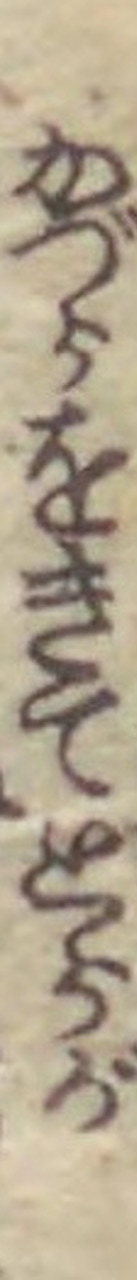かづらをきてとらが
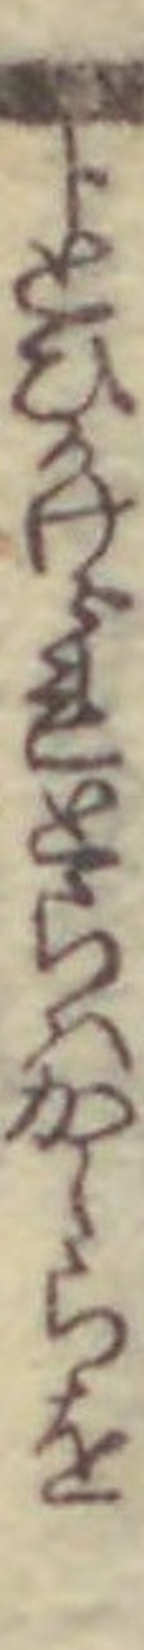ととひかけられとらはかしらを
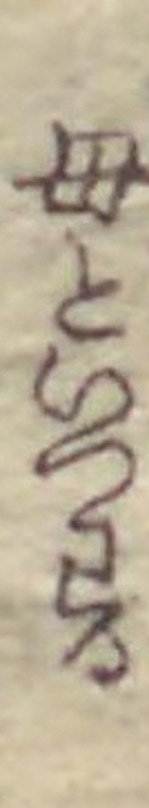母といつわる
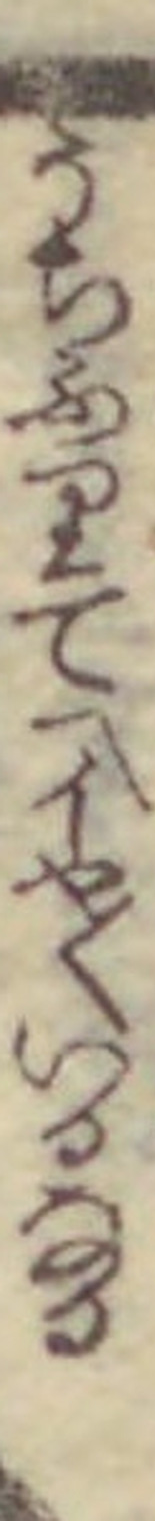うちふりて〽イヤ〳〵いかなる
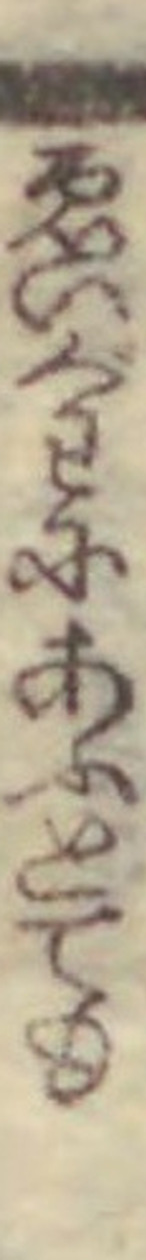ゑいぐわにあふとても
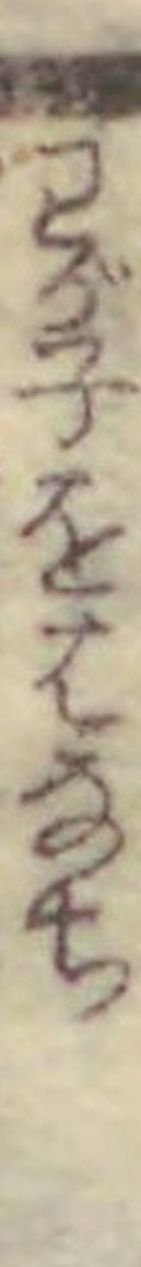わが子をはなち
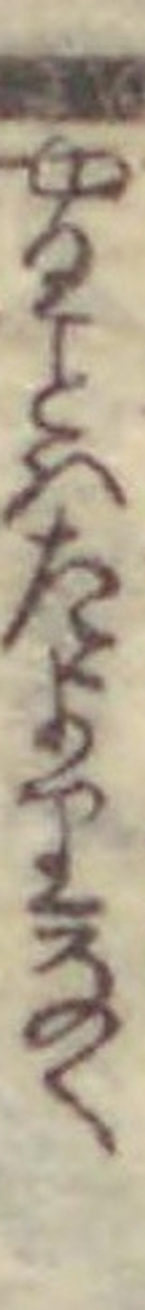やることはたよりなく
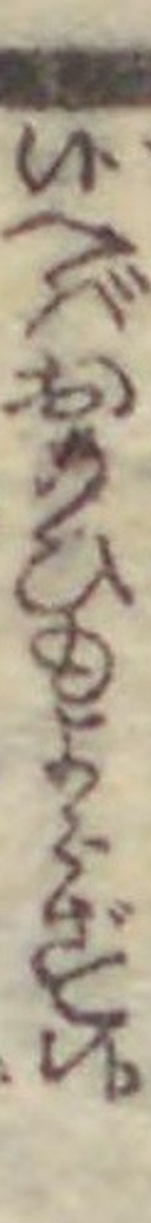候へばおもひもよらず候
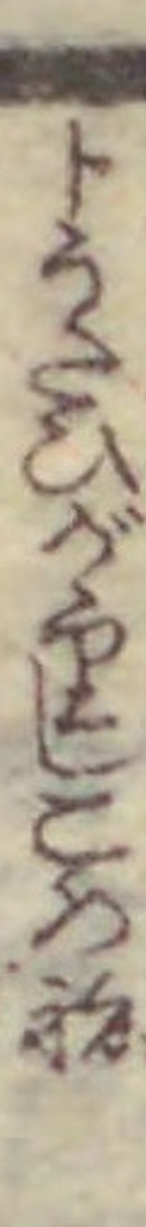とうたひかゝりしこはね
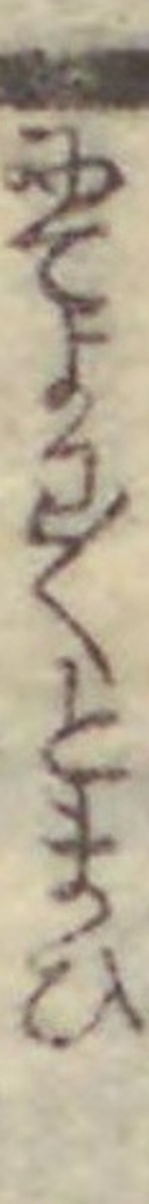にてよわ〳〵とまひ
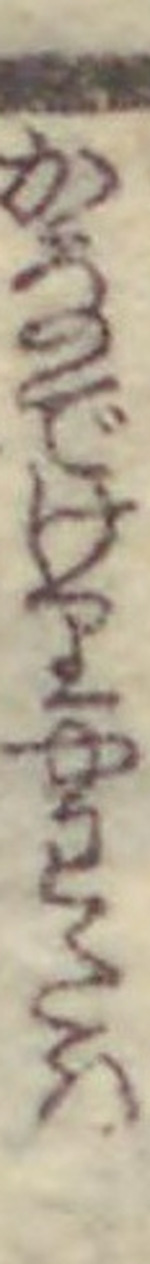かなでけりやわたは
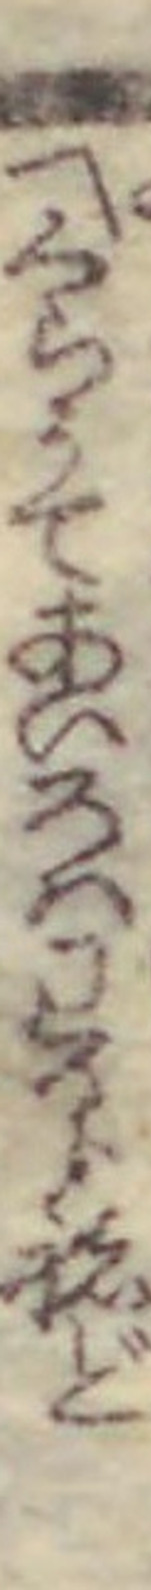〽くらうてあいろはわからねど
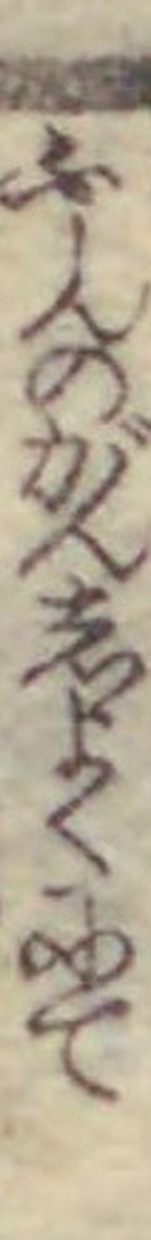ふしんのがんしよくにて
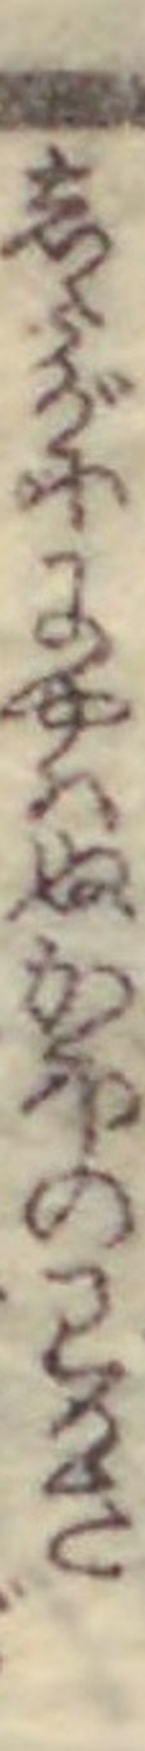しらがににやはぬかほのわかさ
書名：大時代唐土化物 3巻. 曽我太夫染
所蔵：国立国会図書館 National Diet Library, JAPAN
